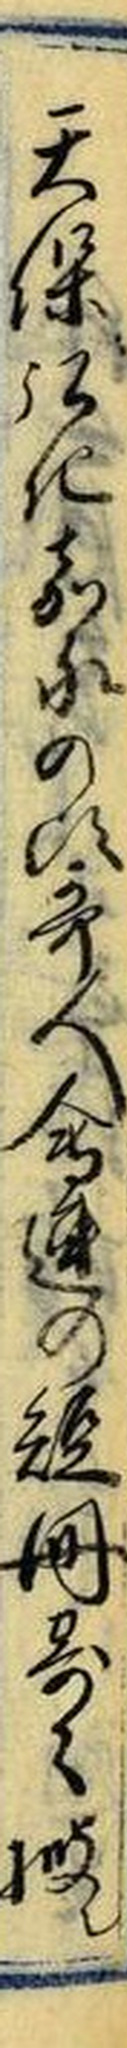天保弘化嘉永の頃哥人会連の短冊寄々披し
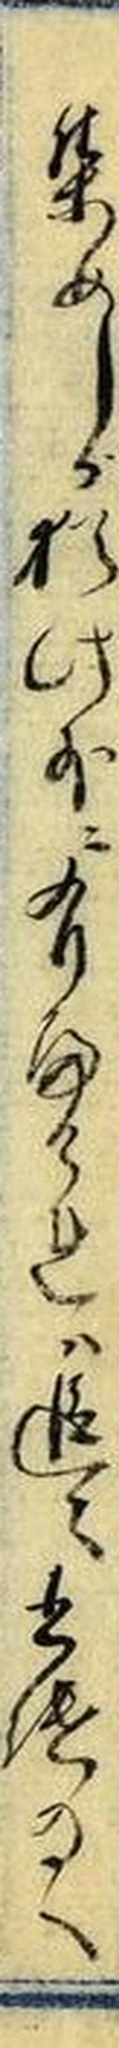集めしが猶此外に有へけれは追々書継給へ
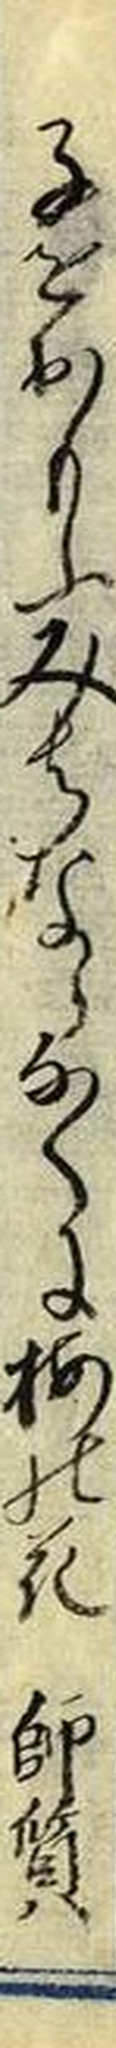子をおもふみちならなくに梅の花師質
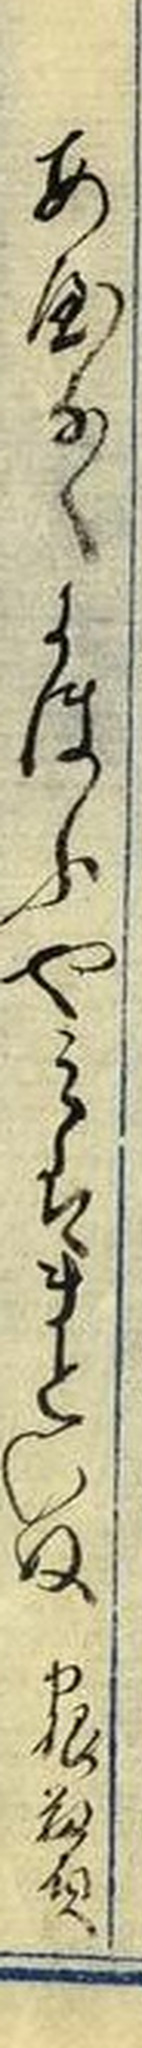あやなくにほふやみはまとひぬ中野靱負
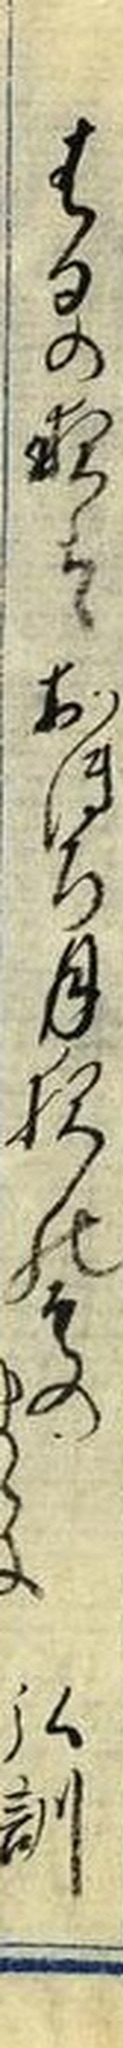はるの夜はおほろ月夜のそのまゝに弘訓
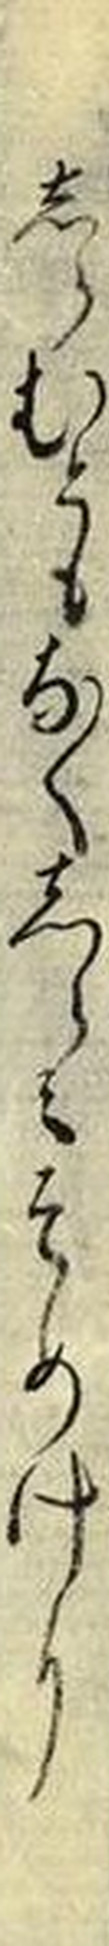しらむともなくしらみそめけり
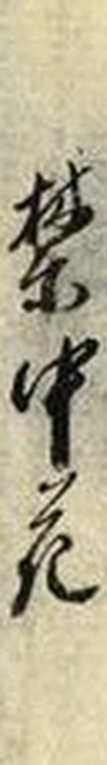禁中花
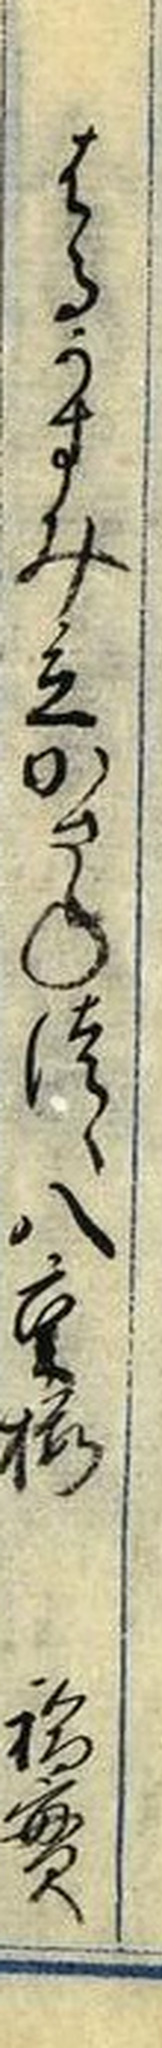はるかすみ立かさねつゝ八重桜福実
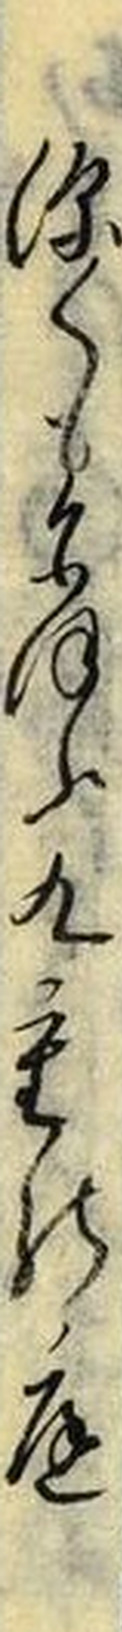深くもにほふ九重の庭

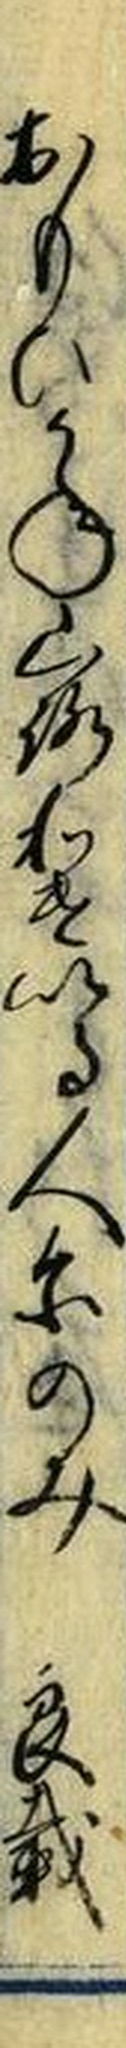おもひかね山路わけいる人にのみ良載
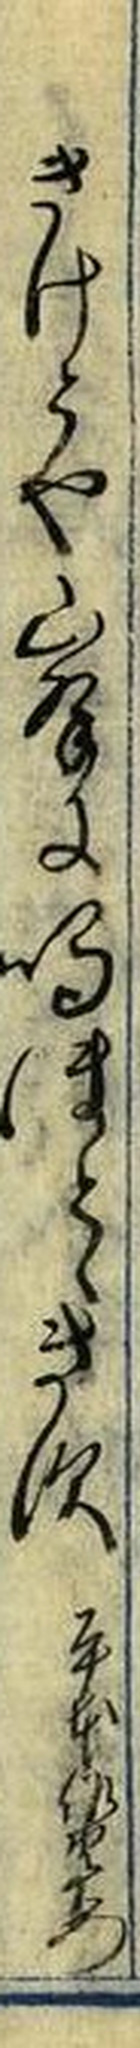きけとや峰に鳴ほとゝきす平本作由右衛門
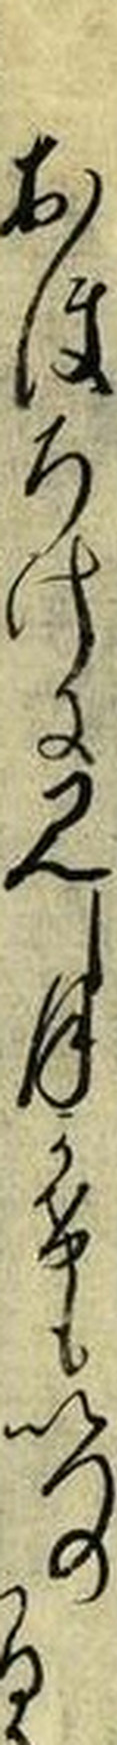おほろけに見し月かけもいつの間に
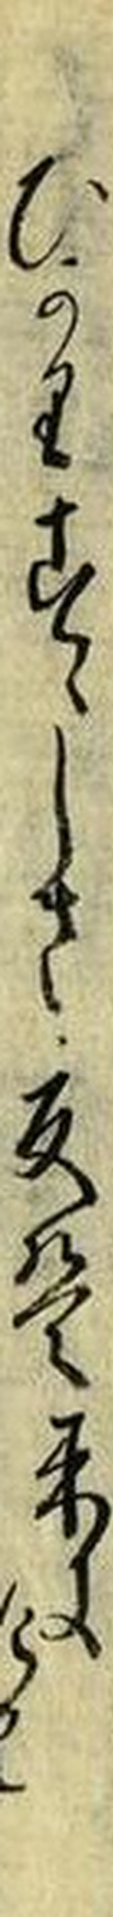ひかりすゝしき夏は来にけり
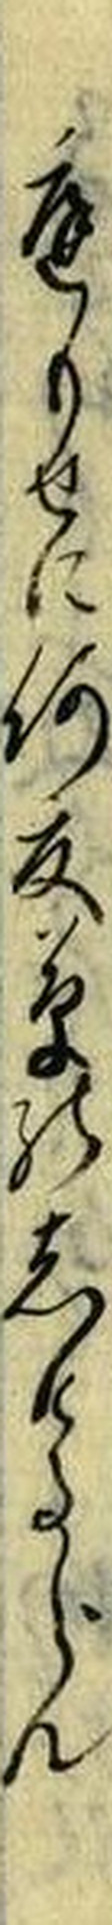庭もせに何夏草のしけるらん友嶌
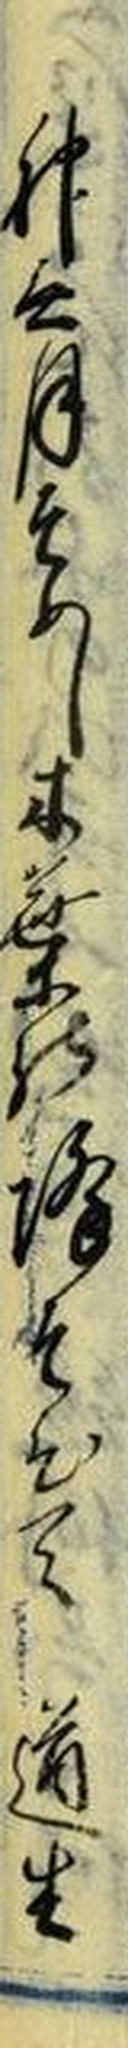神無月そめし木葉の降そひて道生
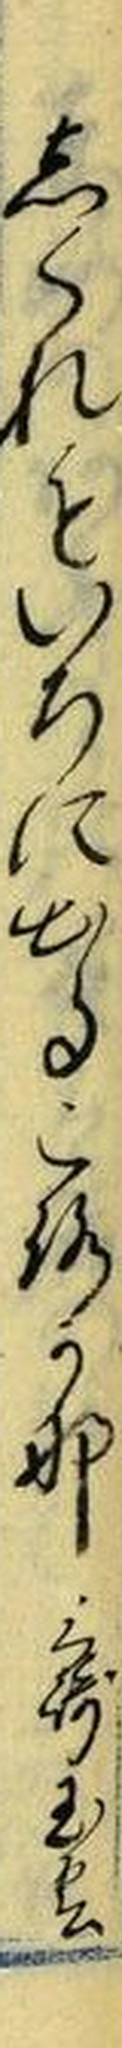しくれもいろに出るころかな三崎玉雲
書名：温古集 三巻
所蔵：福井県文書館 Fukui Prefectural Archives
